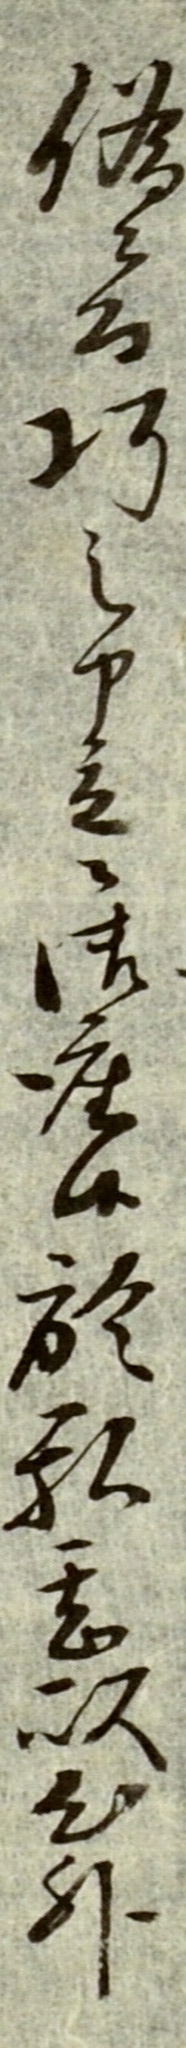偽ニ而巧之申立ニ御座候於私甚以心外
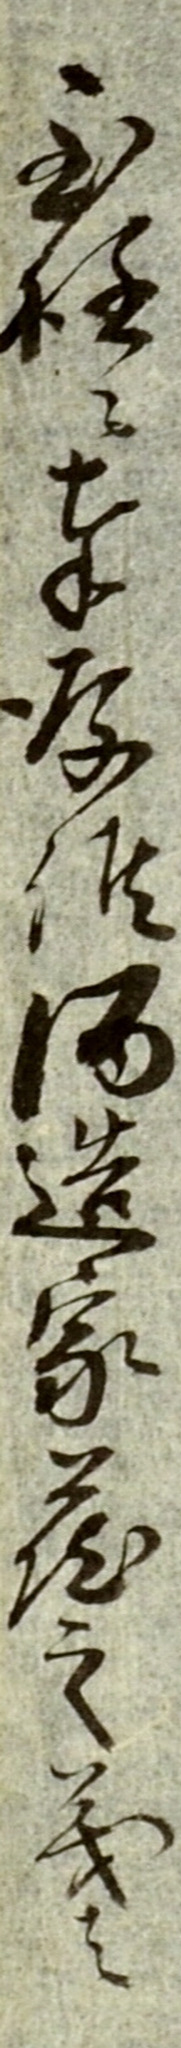至極ニ奉存候酒造家蔵之義者
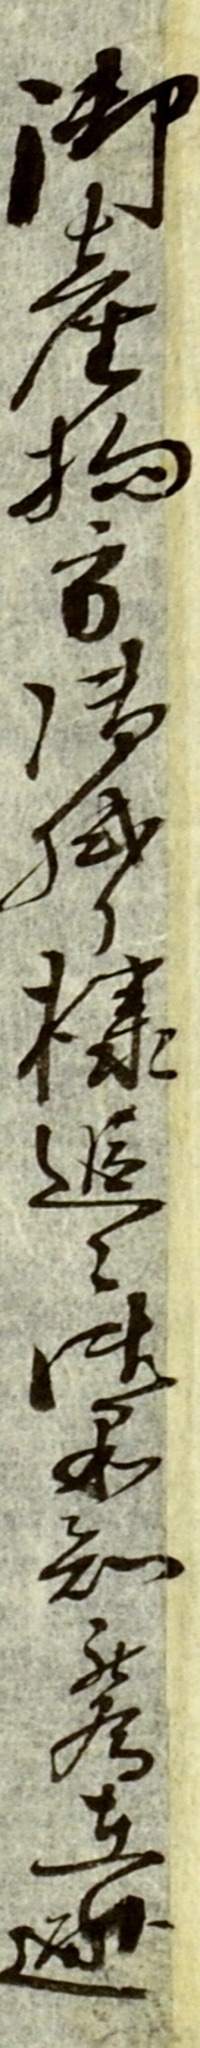御産物方御掛り様追々御承知被為在候通
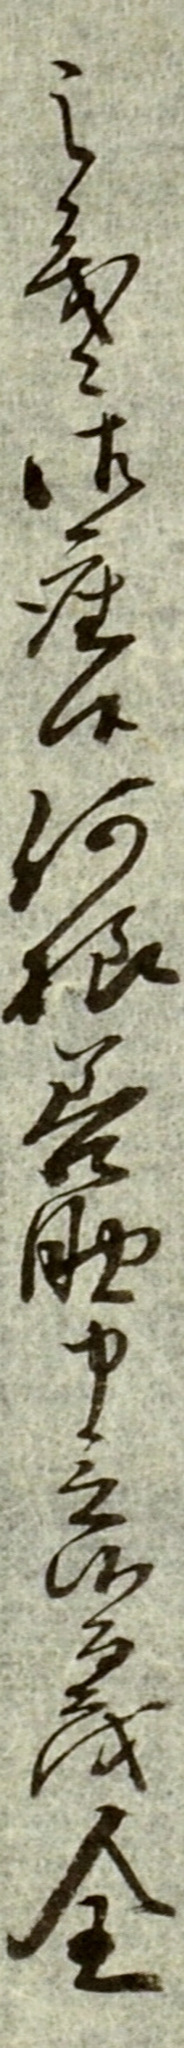之義ニ御座候何様善助申立候而茂全
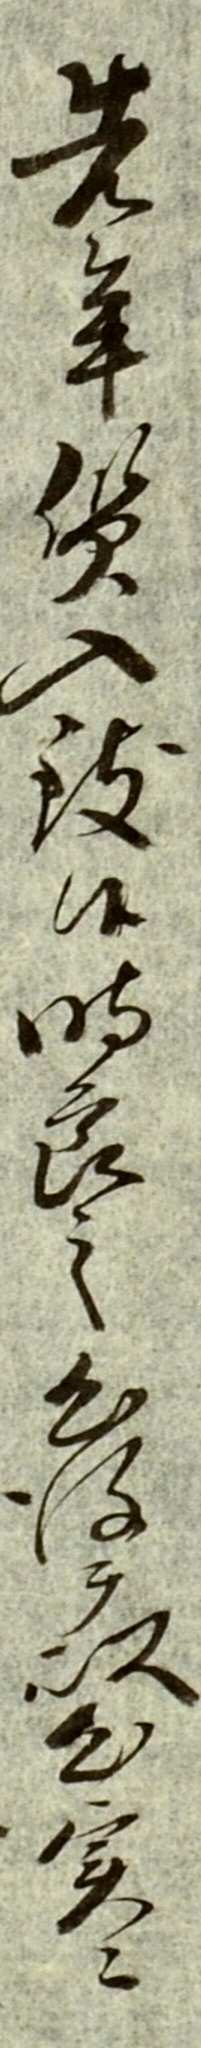先年質入致候時節之心得ヲ以心実ニ
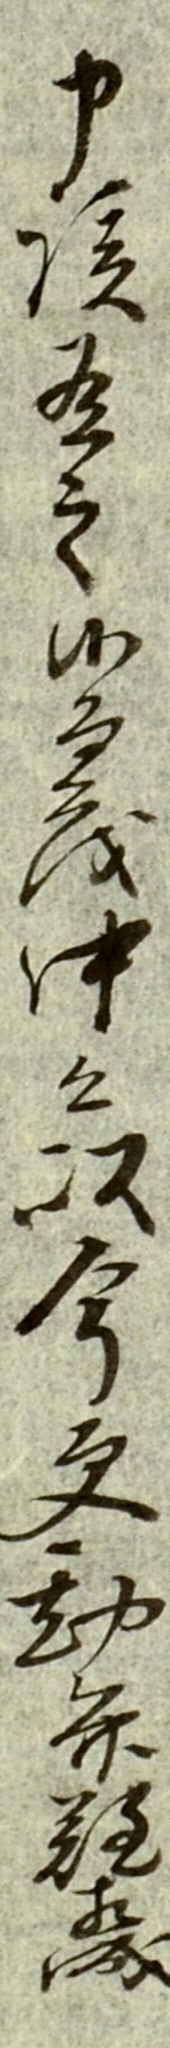申段有之候而茂中々以今更勘弁難相成
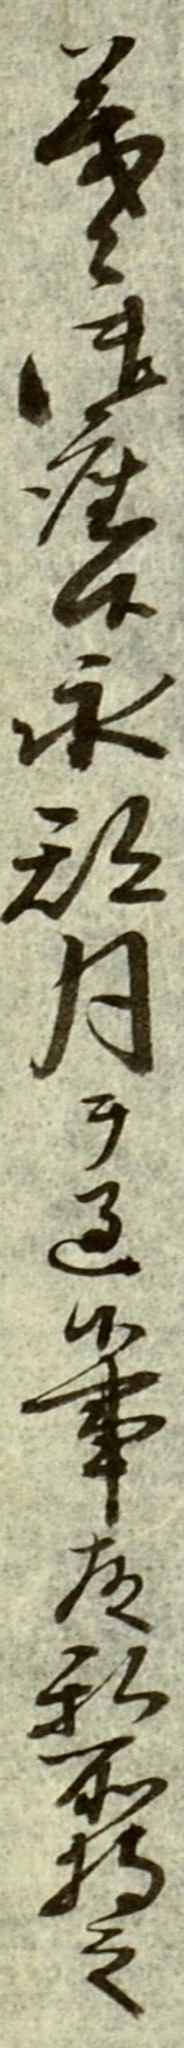義ニ御座候永期月ヲ過候事故私所持之
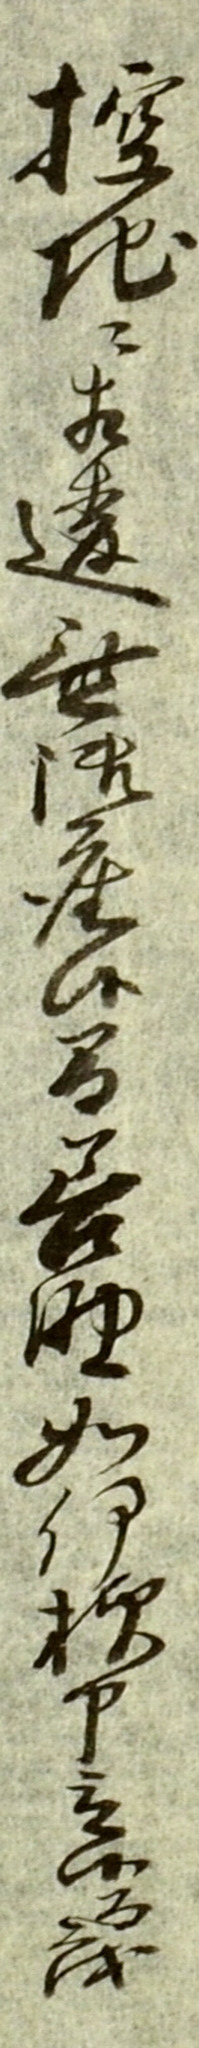控地ニ相違無御座候間善助如何様申立候而茂
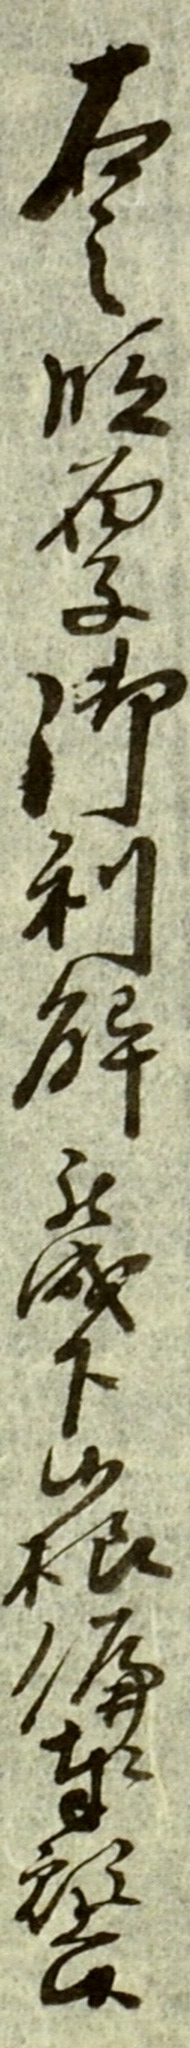右之段厚御利解被成下候様偏ニ奉願上候
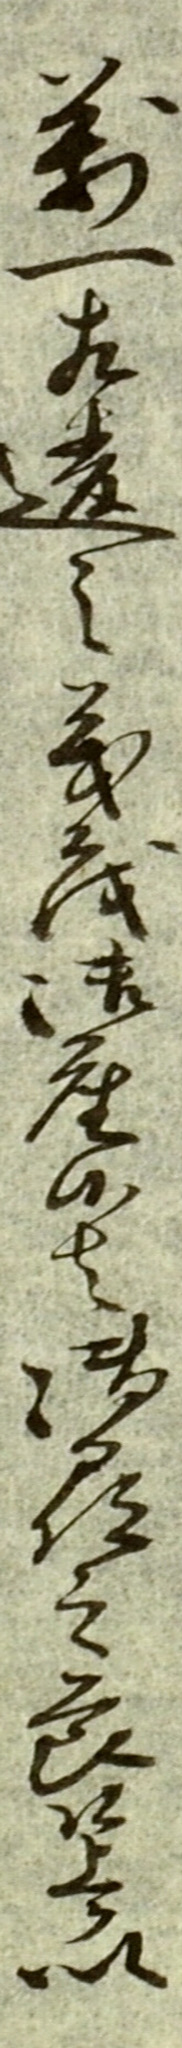万一相違之義茂御座候者御尋之節口上ヲ以
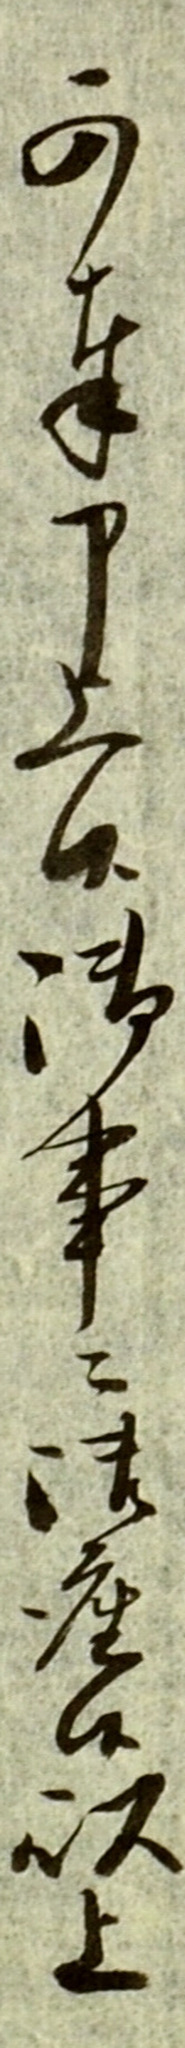可奉申上候御事ニ御座候以上
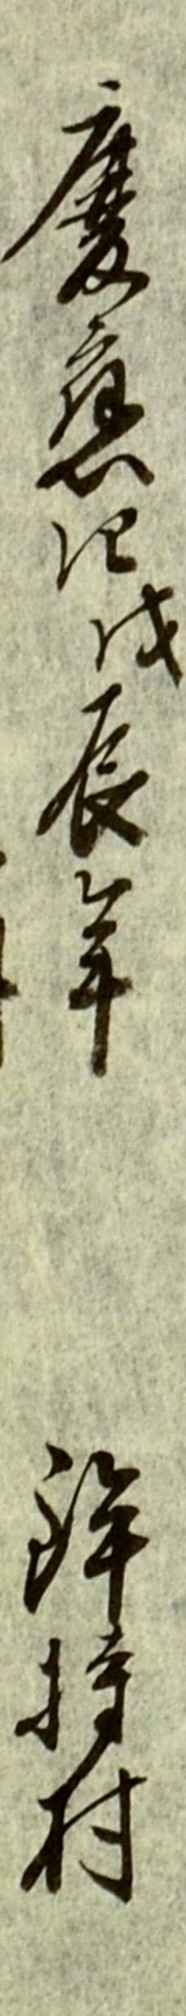慶応四戊辰年鉾持村
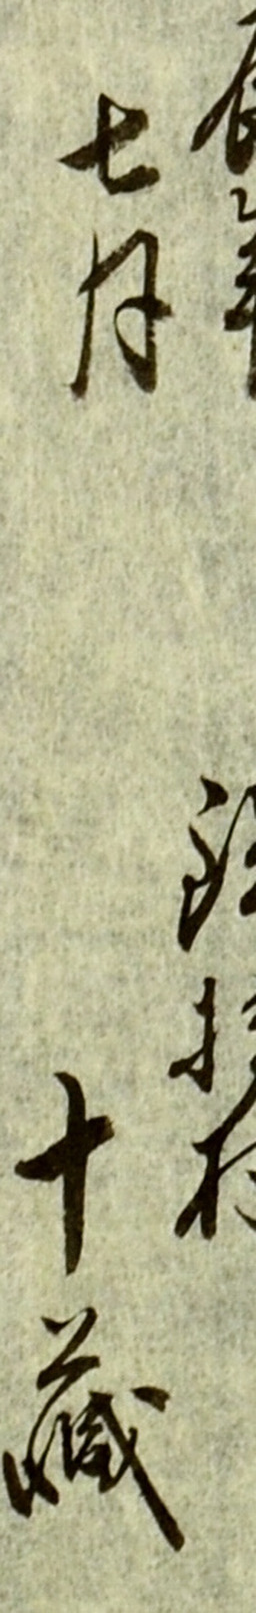七月十蔵
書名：乍恐以口上書奉申上候御事
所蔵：伊那市立高遠町図書館・合同会社AMANE
